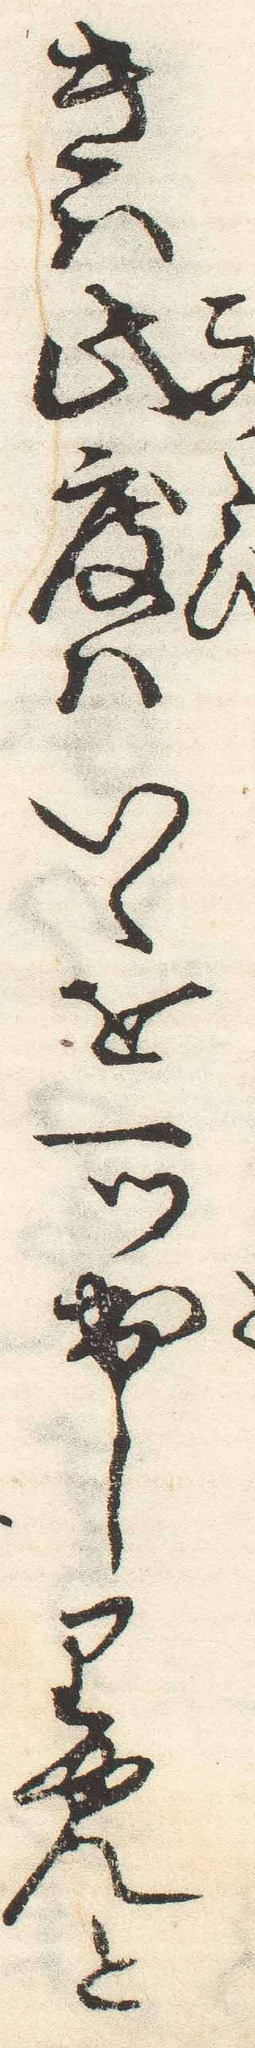きは此度はいゝを一ッ出しりやんと
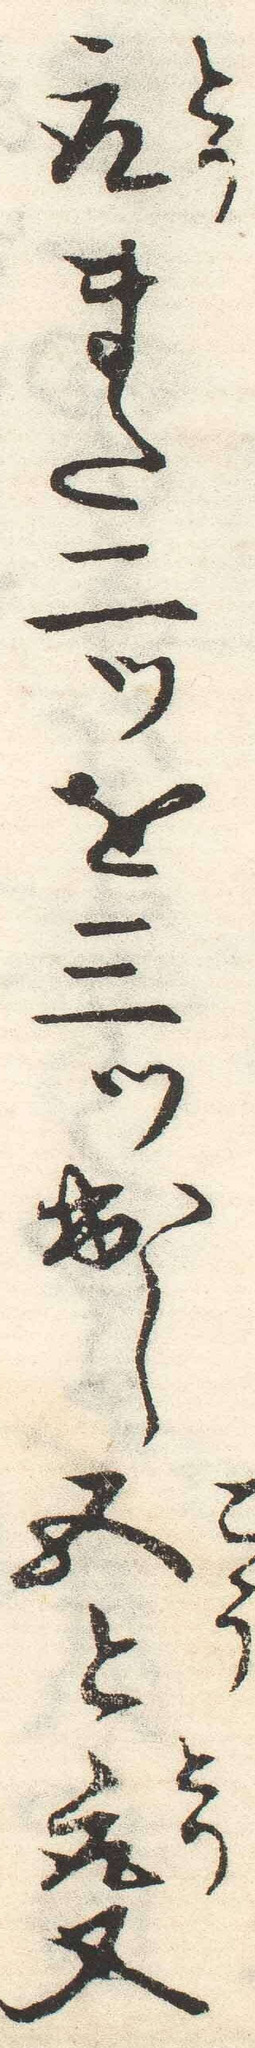取また二ッを三ッ出し五と取又
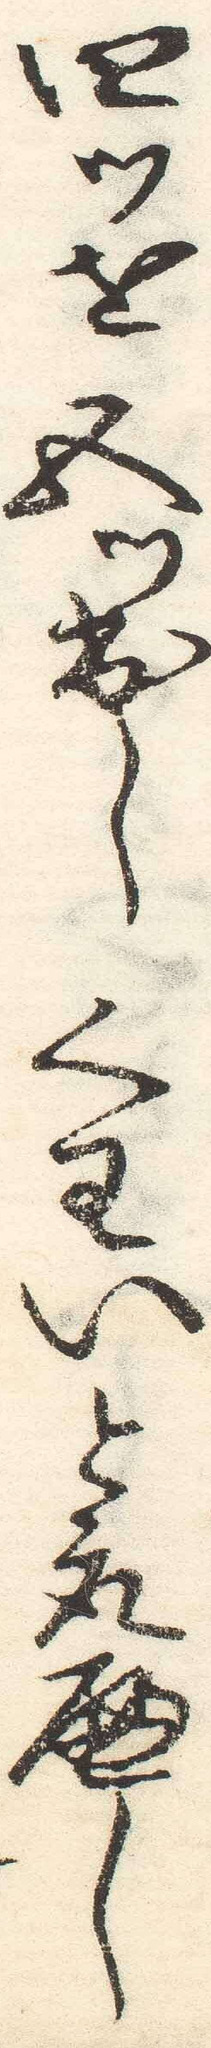四ッを五ッ出しくわいと取へし
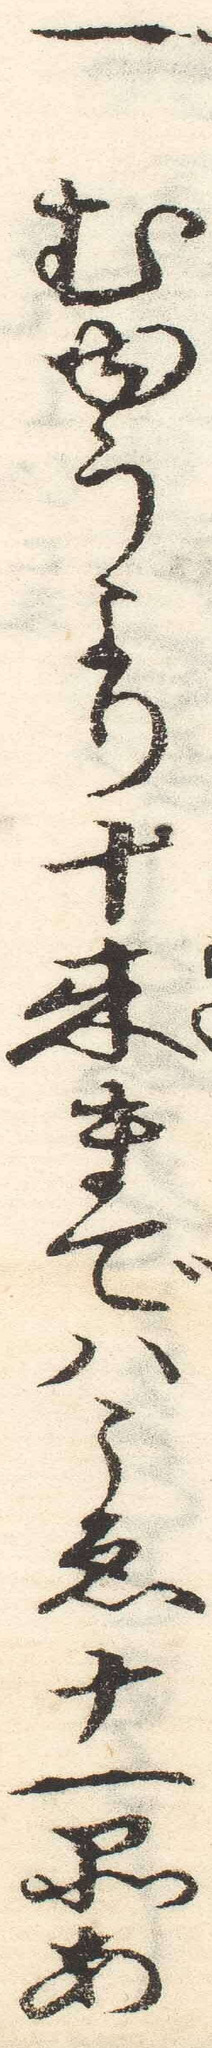一むゆうより十来まではこゑ十一品あ
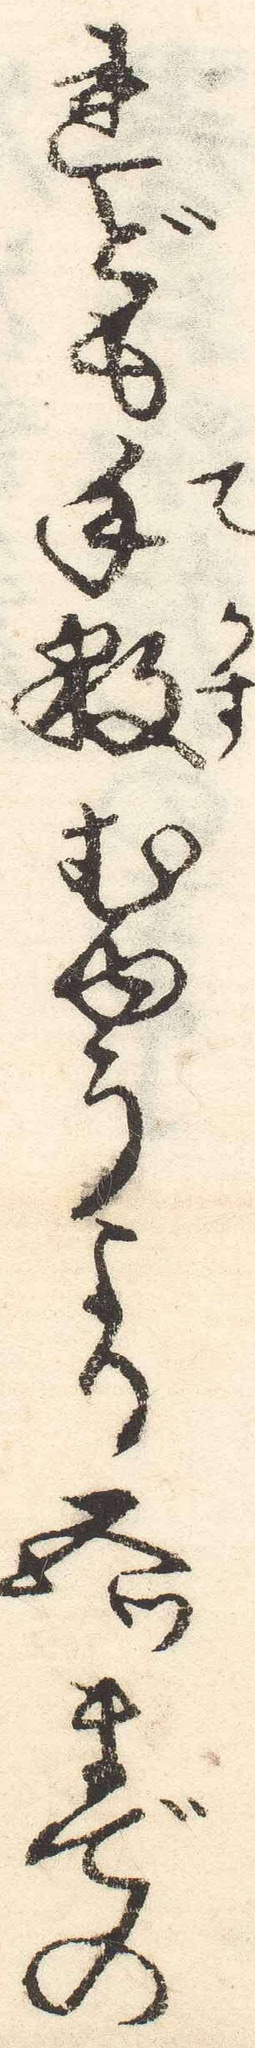れども手数むゆうより五ッまでの
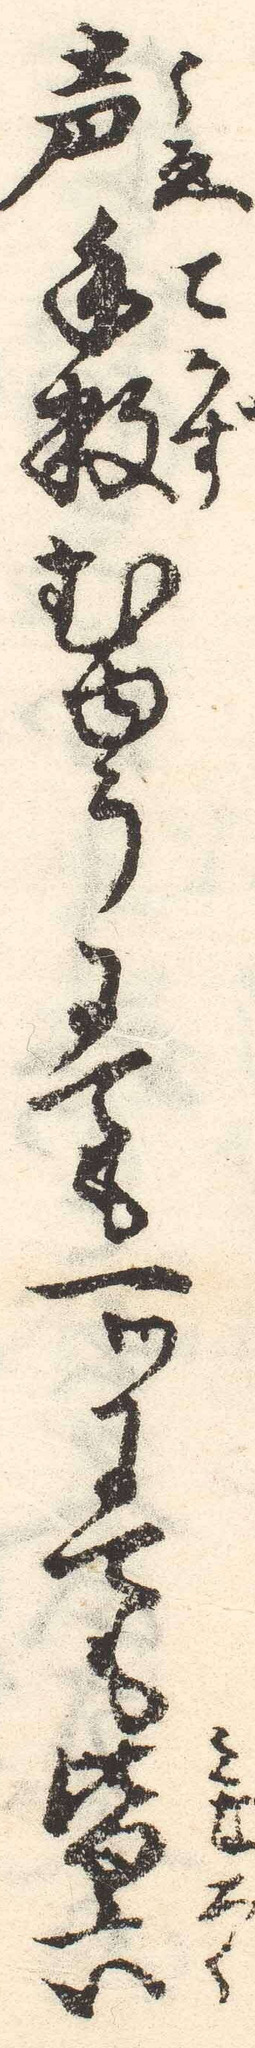声手数むゆうにても一ッにても皆六
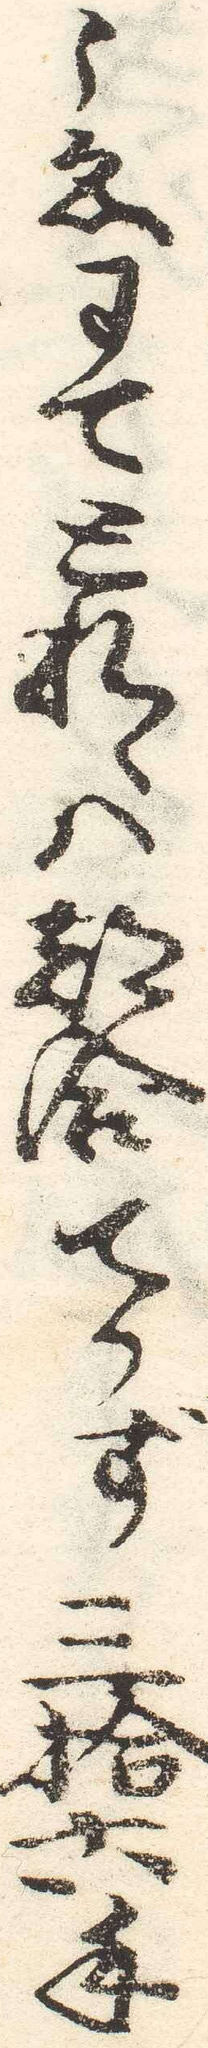こゑにてとれゝは都合てかず三拾六手
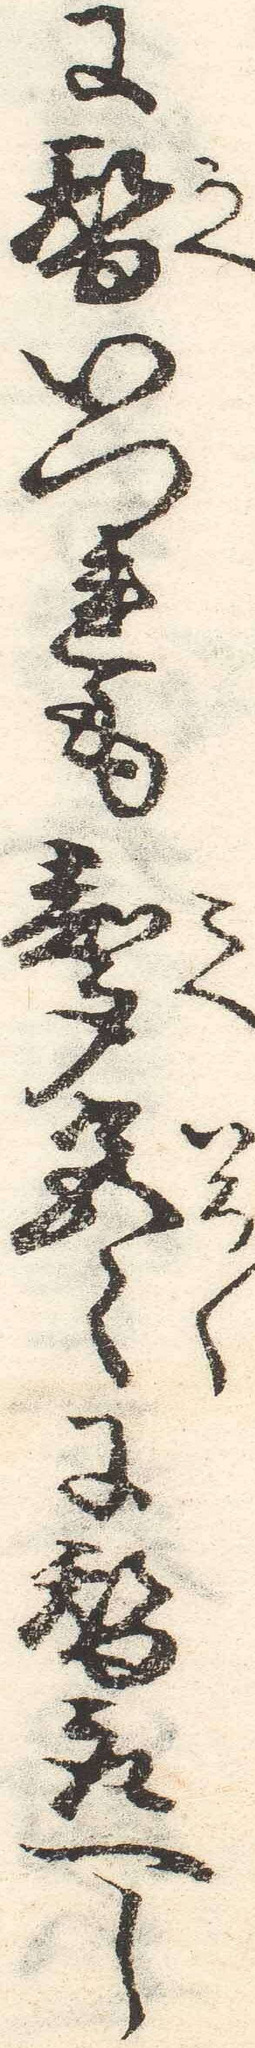に替いつれも声色々に替取へし
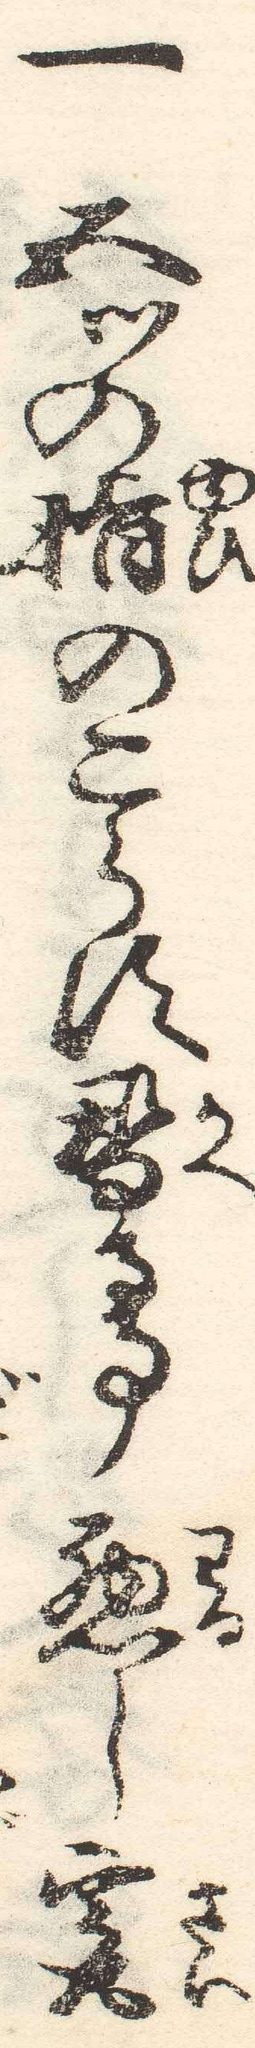一五ッの指のこらす替る事悪し最
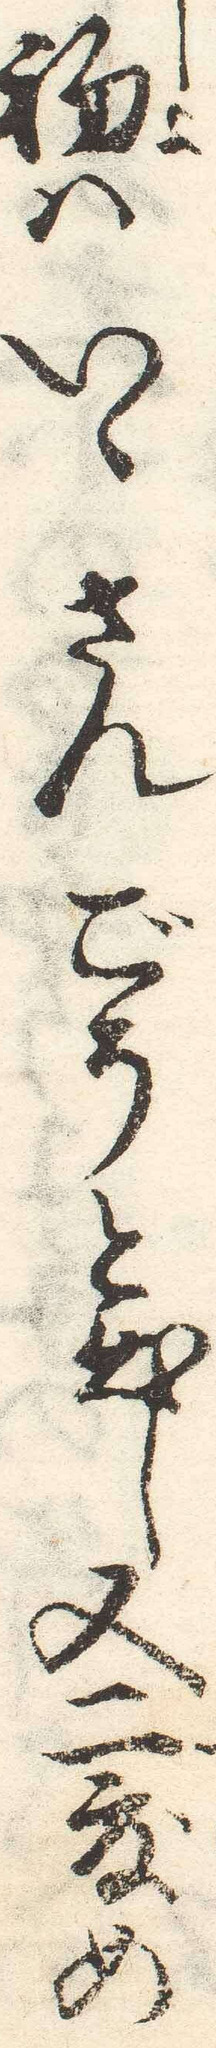初はいゝさんごうと出し又二度め
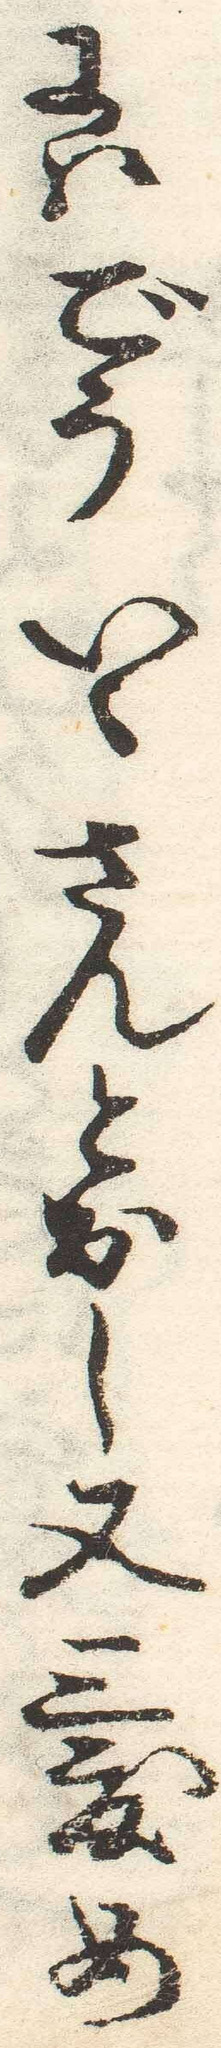にはごういゝさんと出し又三度め
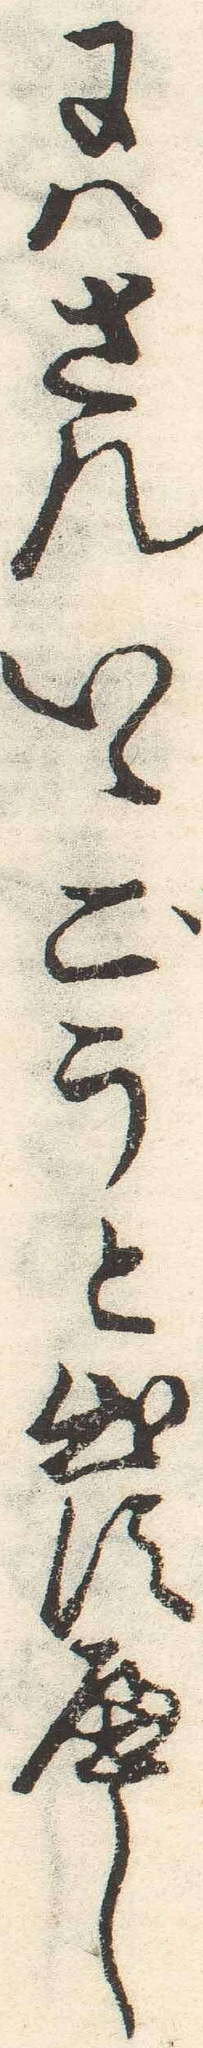にはさんいゝごうと出すへし

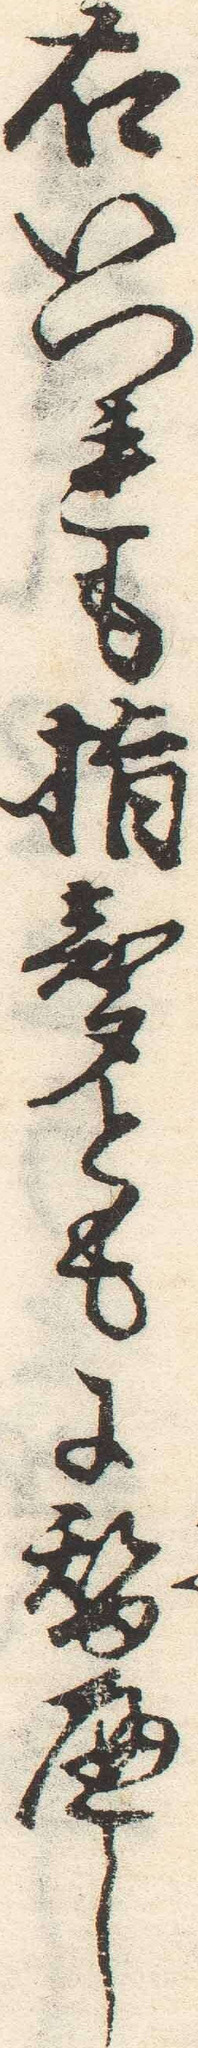右いつれも指声ともに替へし
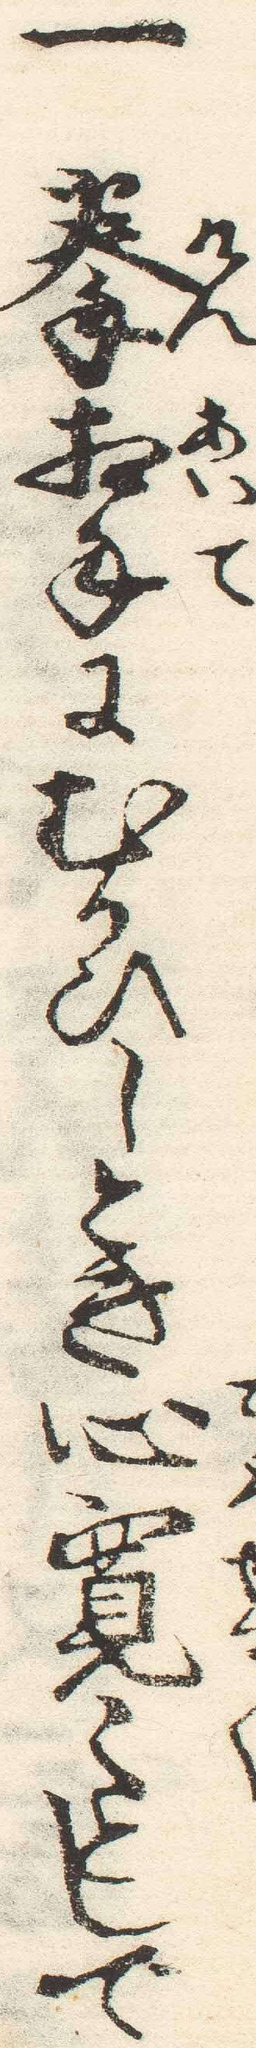一拳相手にむかひしとき心寛々として
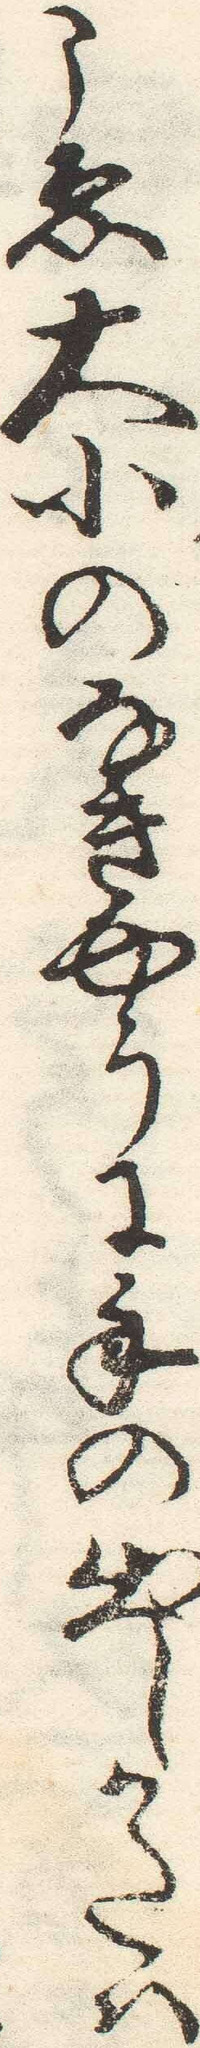こゑ大小のなきやうに手の出しかたは
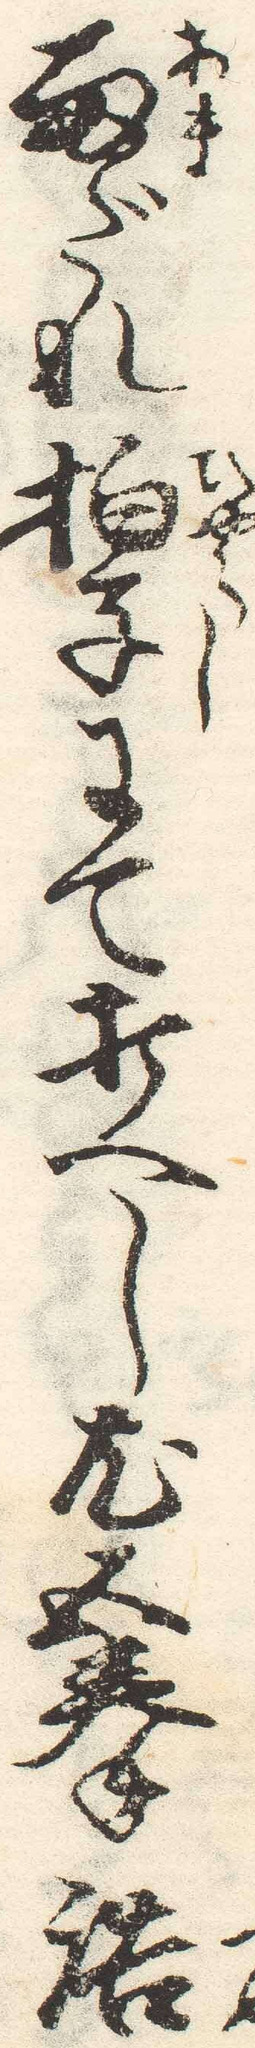雨だれ拍子にて打へし尤五拳詰
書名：拳独稽古
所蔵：東京学芸大学附属図書館 国文学研究資料館
